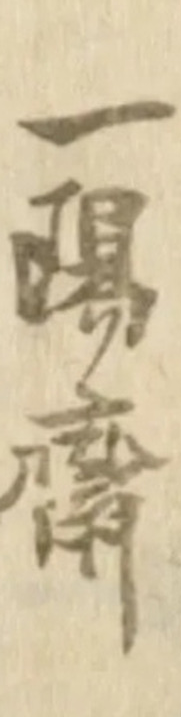一陽斎
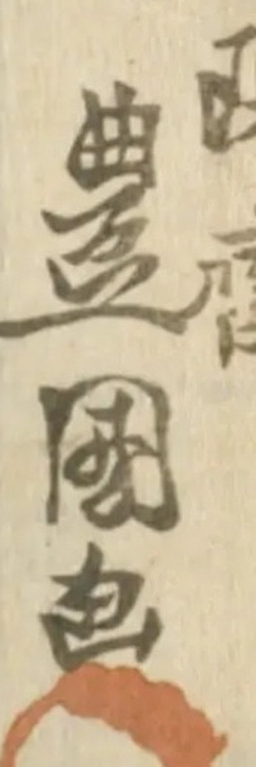豊国画
